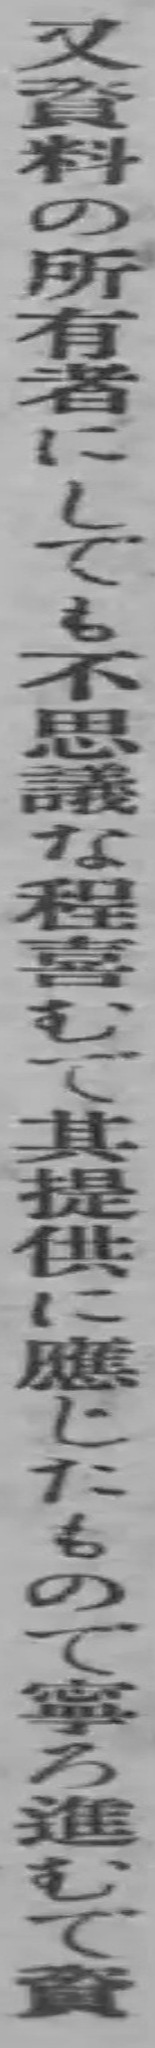又資料の所有者にしても不思議な程喜むで其提供に応じたもので寧ろ進むで資
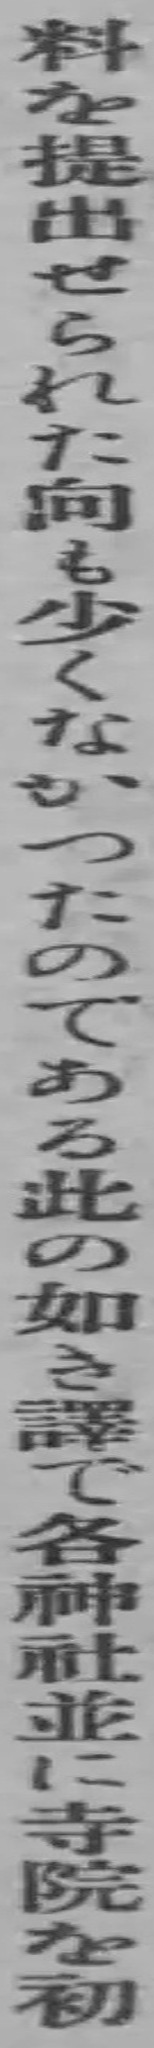料を提出せられた向も少くなかつたのである此の如き訳で各神社並に寺院を初
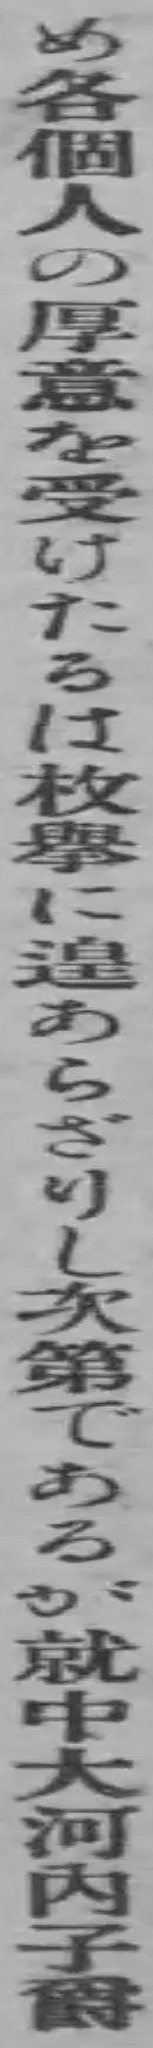め各個人の厚意を受けたるは枚挙に遑あらざりし次第であるが就中大河内子爵
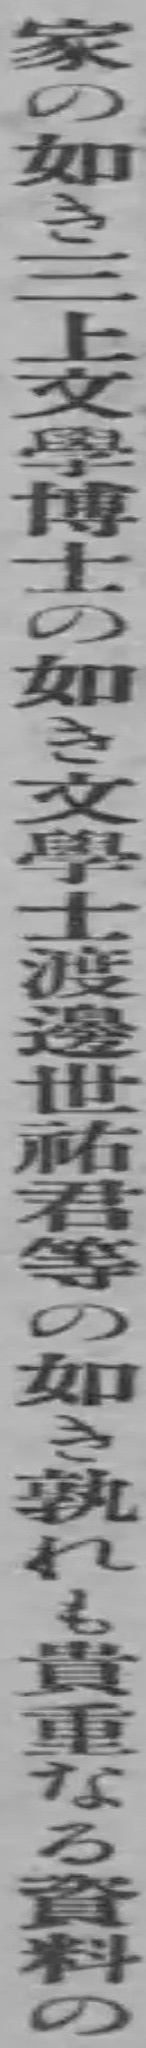家の如き三上文学博士の如き文学士渡邊世祐君等の如き孰れも貴重なる資料の
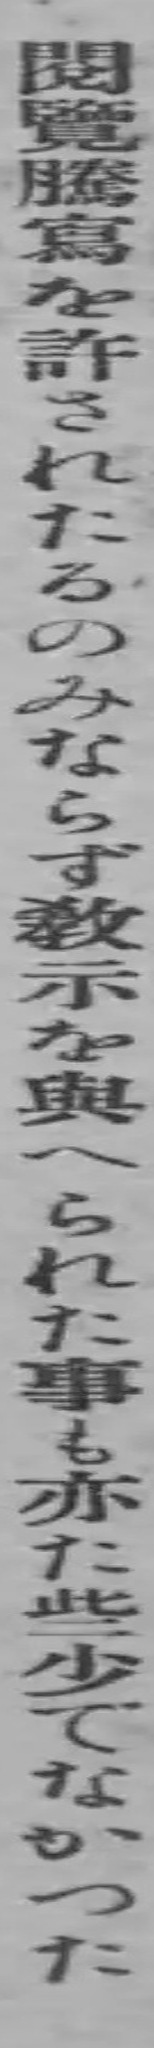閲覧謄写を許されたるのみならず教示を与へられた事も亦た些少でなかつた
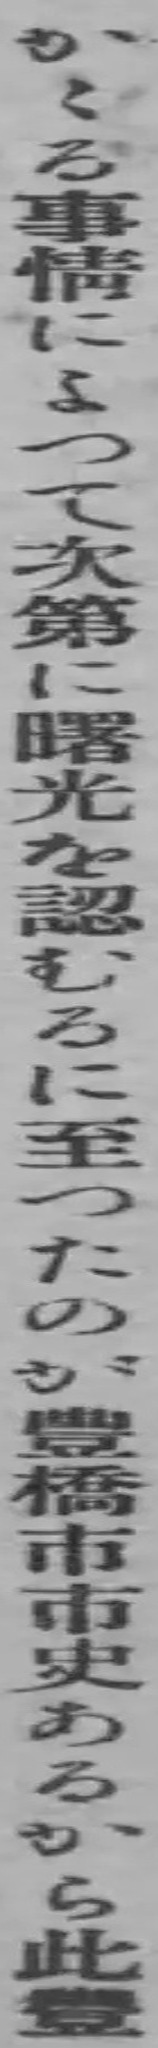かゝる事情によつて次第に曙光を認むるに至つたのが豊橋市市史あるから此豊
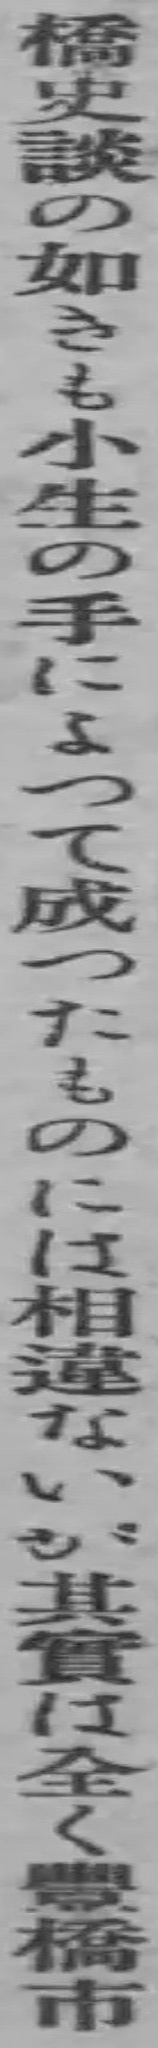橋史談の如きも小生の手によつて成つたものには相違ないが其実は全く豊橋市
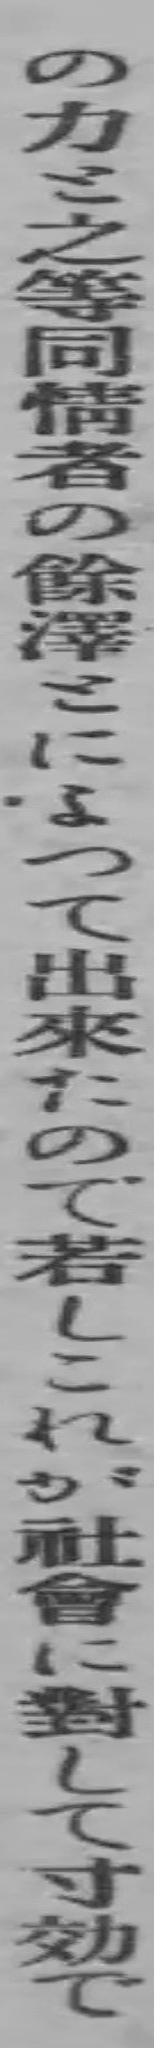の力と之等同情者の余沢とによつて出来たので若しこれが社会に対して寸効で
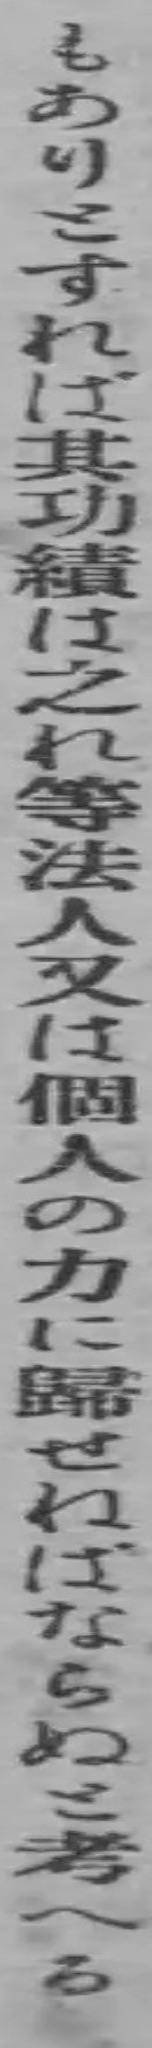もありとすれば其功績は之れ等法人又は個人の力に帰せねばならぬと考へる
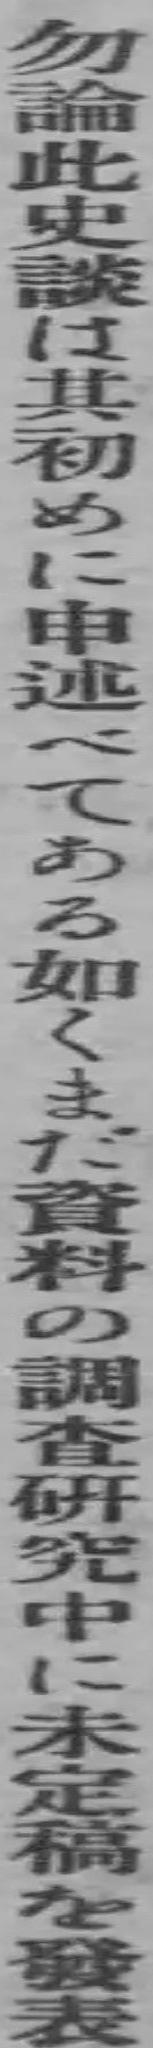勿論此史談は其初めに申述べてある如くまだ資料の調査研究中に未定稿を発表
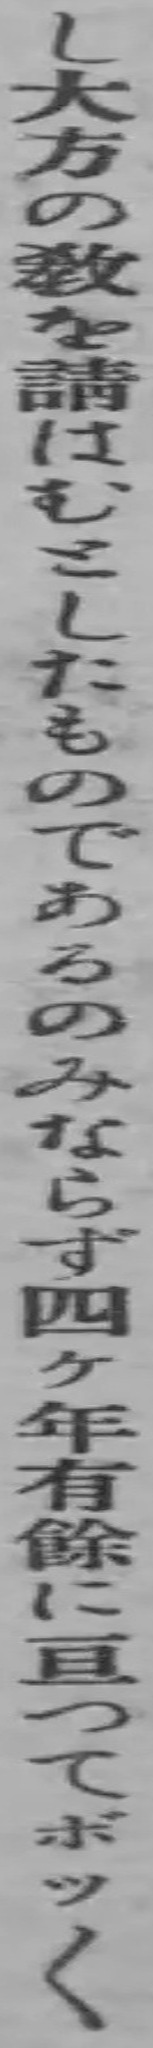し大方の教を請はむとしたものであるのみならず四ケ年有余に亘つてボツ〳〵
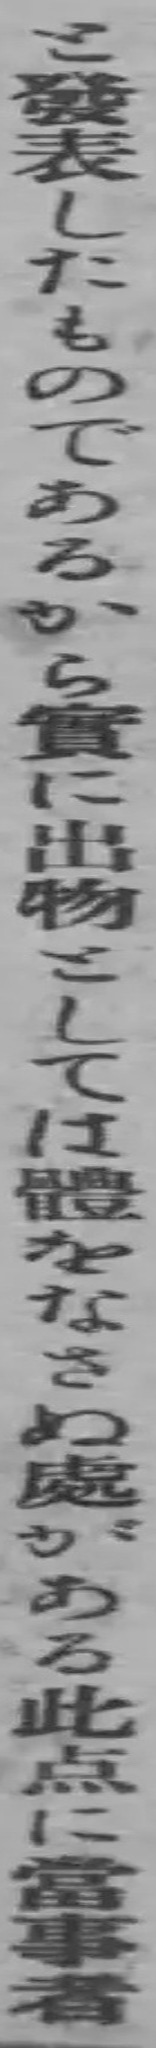と発表したものであるから実に出物としては体をなさぬ処がある此点に当事者
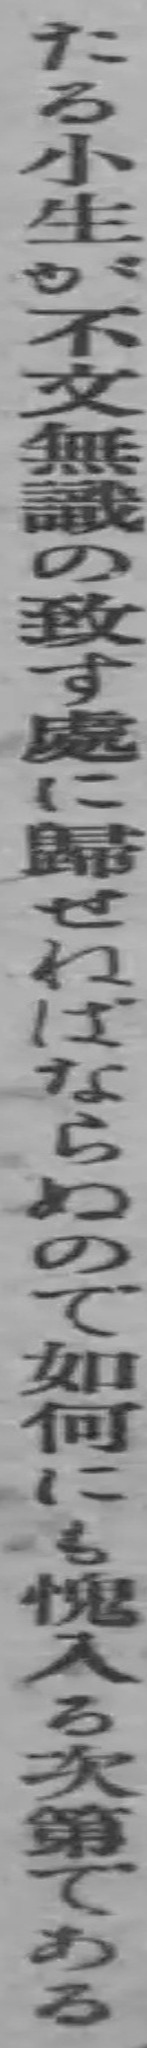たる小生が不文無識の致す処に帰せねばならぬので如何にも愧入る次第である
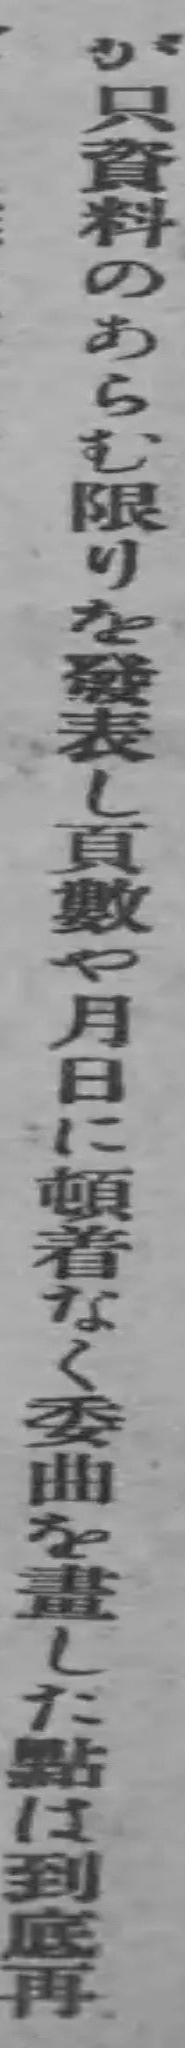が只資料のあらむ限りを発表し頁数や月日に頓着なく委曲を画した点は到底再
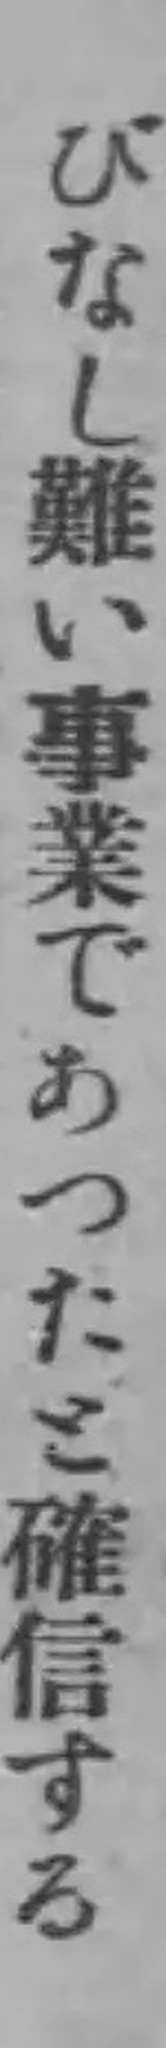びなし難い事業であつたと確信する
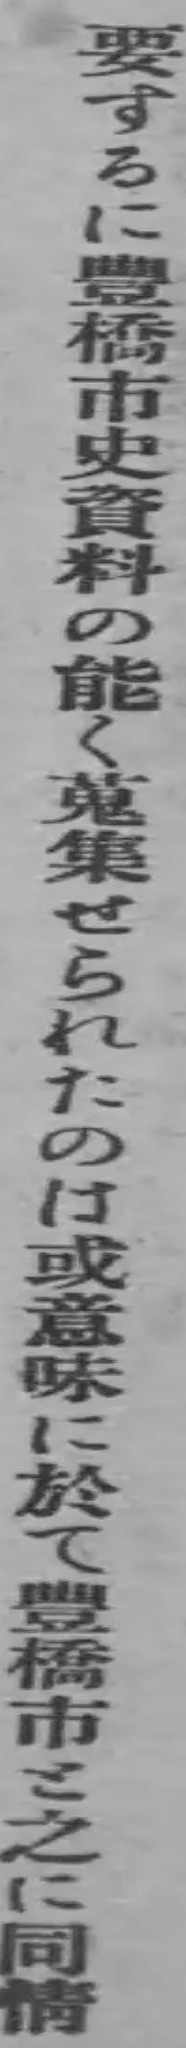要するに豊橋市史資料の能く蒐集せられたのは或意味に於て豊橋市と之に同情
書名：豊橋市史談
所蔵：国立国会図書館 National Diet Library, JAPAN
